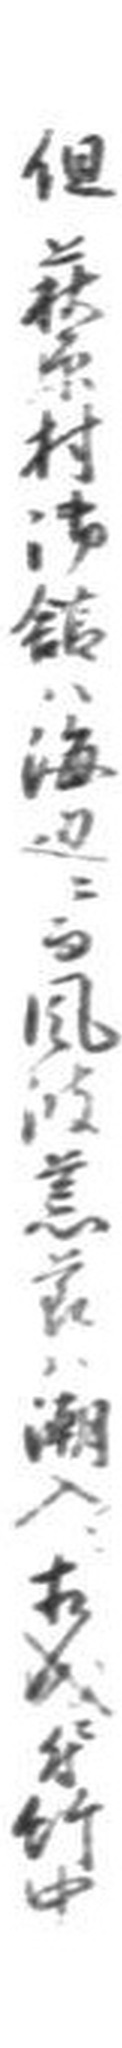但萩原村御館ハ海辺ニ而風波荒節ハ潮入ニ相成ニ付竹中
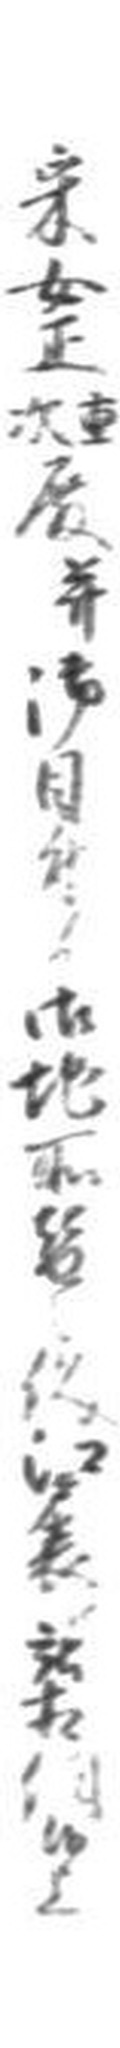次殿并御目付ゟ御地所替之儀江戸表江被相伺候上
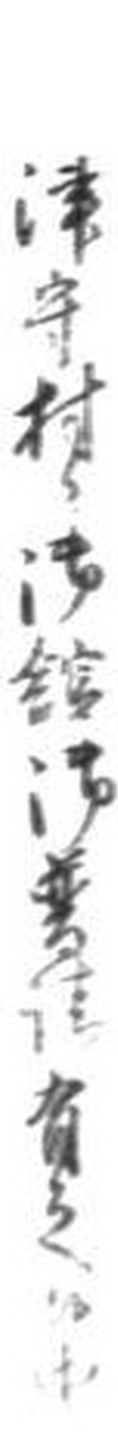津守村へ御館御普請有之候由

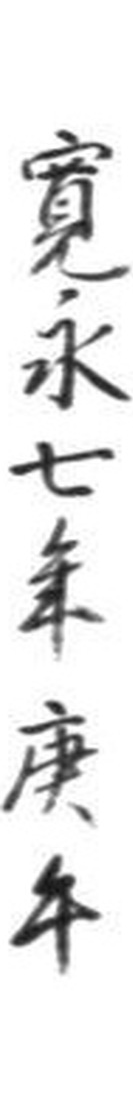寛永七年庚午
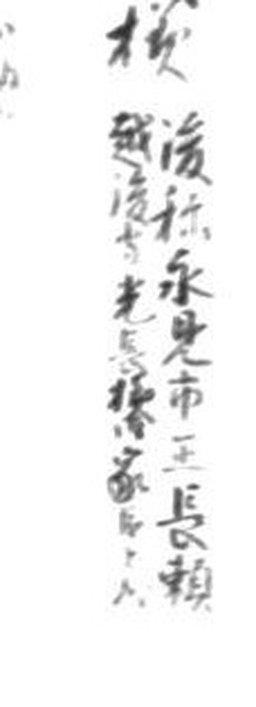越後守光長様御家臣と成
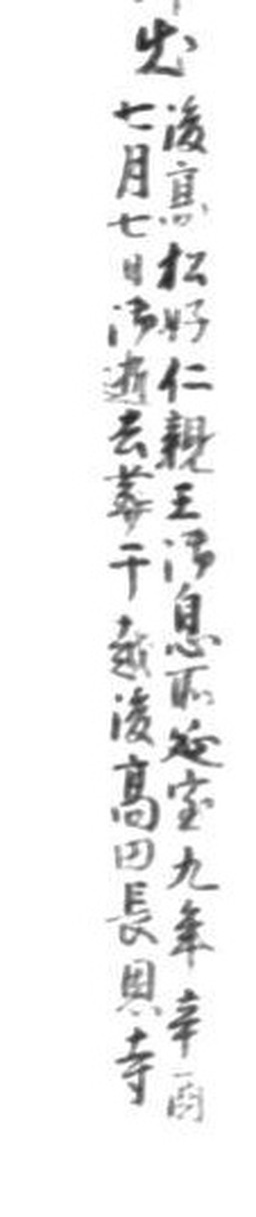七月七日御逝去葬于越後高田長恩寺
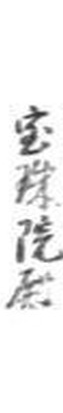宝珠院殿

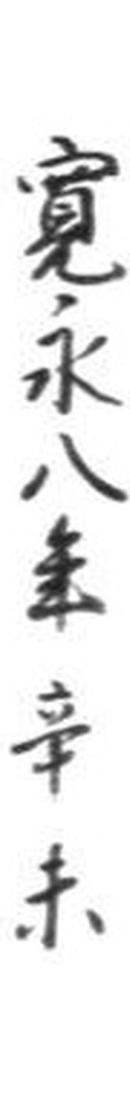寛永八年辛未
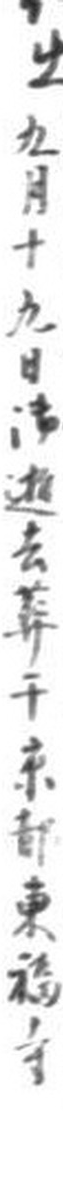九月十九日御逝去葬于京都東福寺
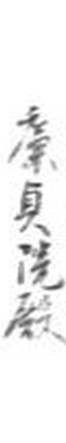廉貞院殿

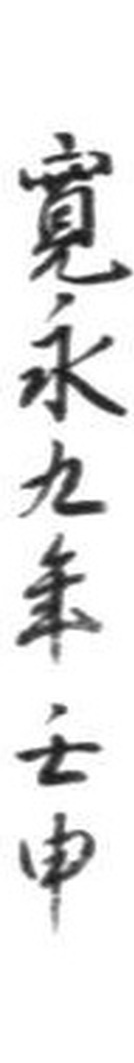寛永九年壬申
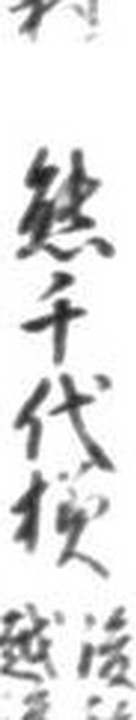松千代様
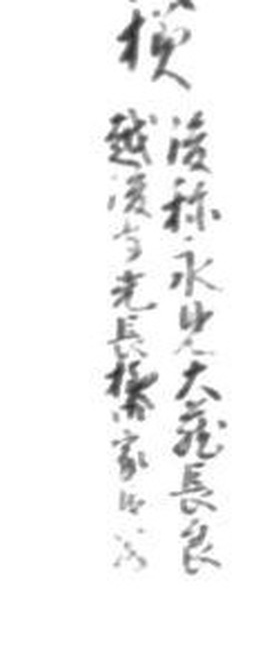越後守光長様御家臣と成
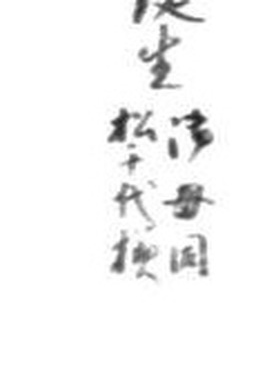松千代様

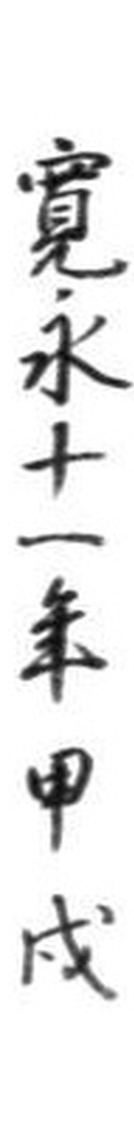寛永十一年甲戌
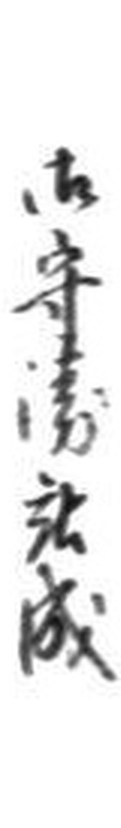御守衛被成
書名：家譜 二 忠直公 従文禄四年到慶安四年
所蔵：福井県文書館 Fukui Prefectural Archives
